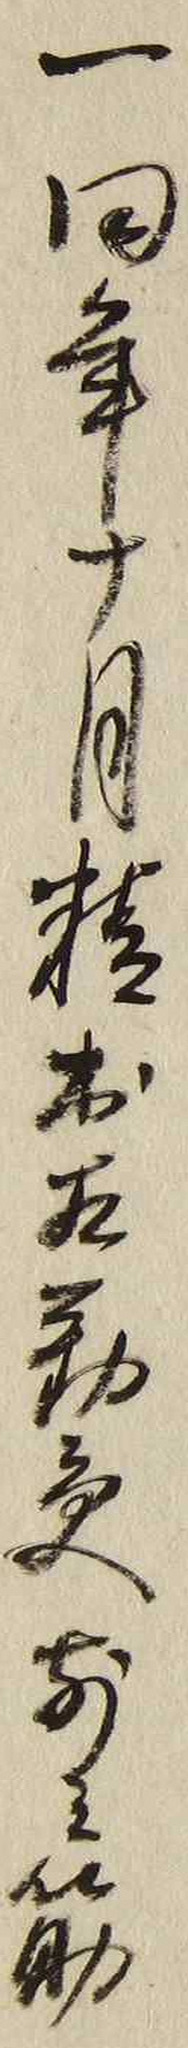一同年十月精出相勤受前之筋

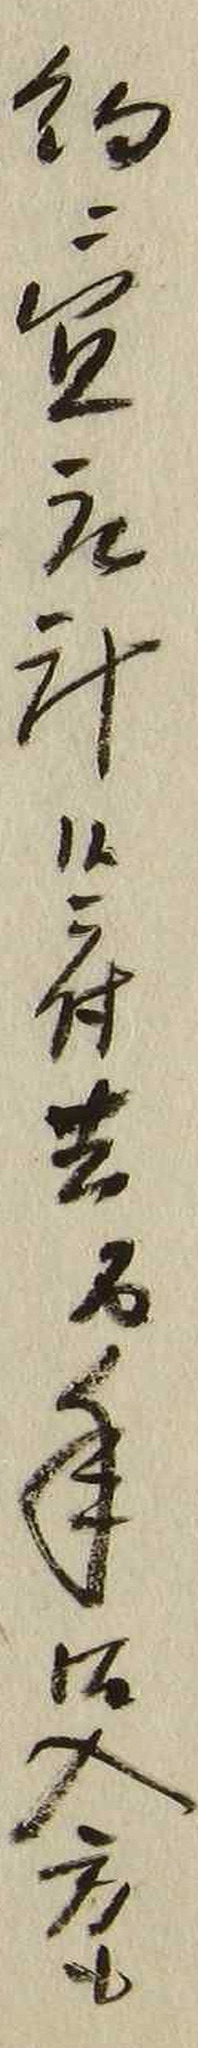約ニ宜取計候ニ付去酉年御入方も
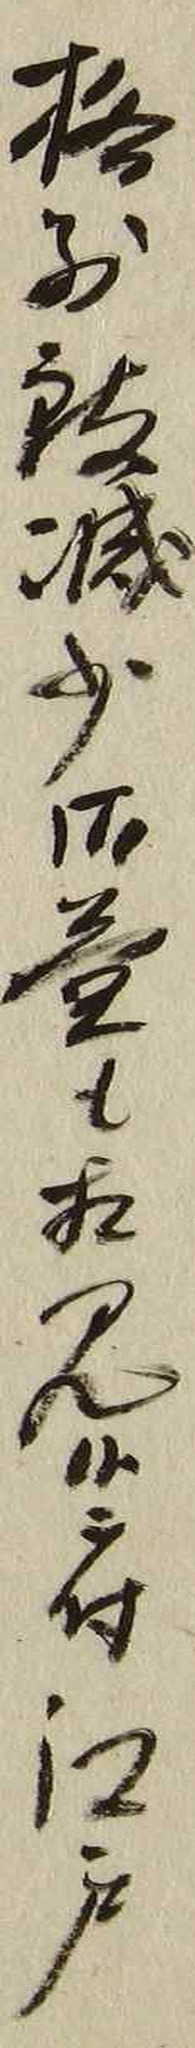格別致減少御益も相見候ニ付江戸
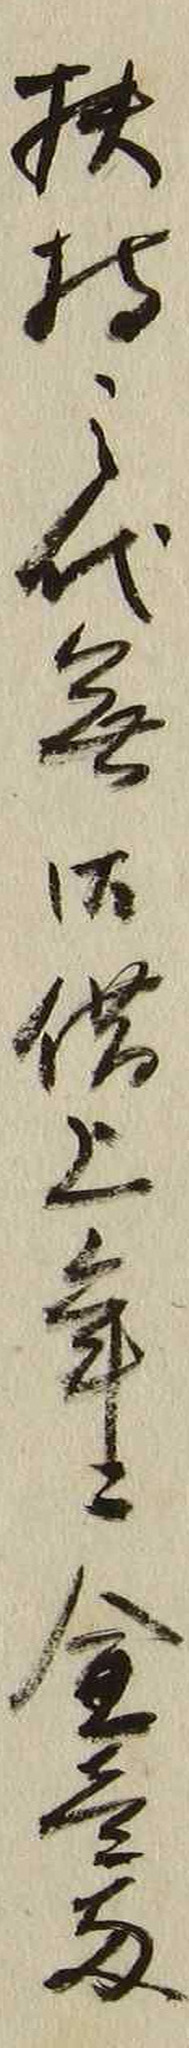扶持之代無御借上年ニ金壱両
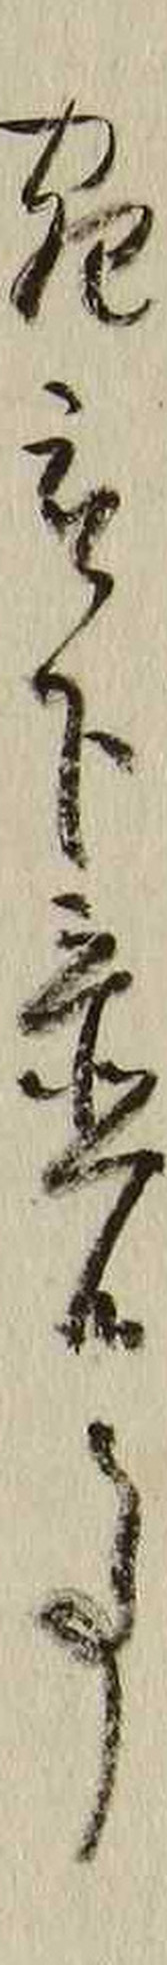宛被下置候事
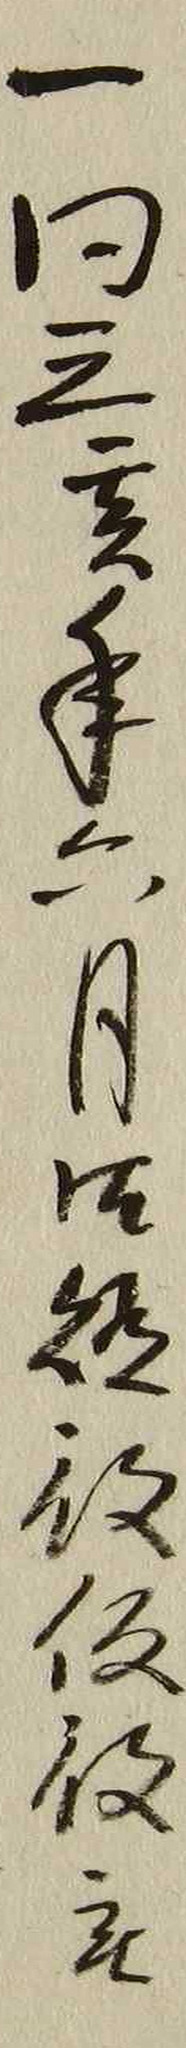一同三亥年六月御賄役仮役被
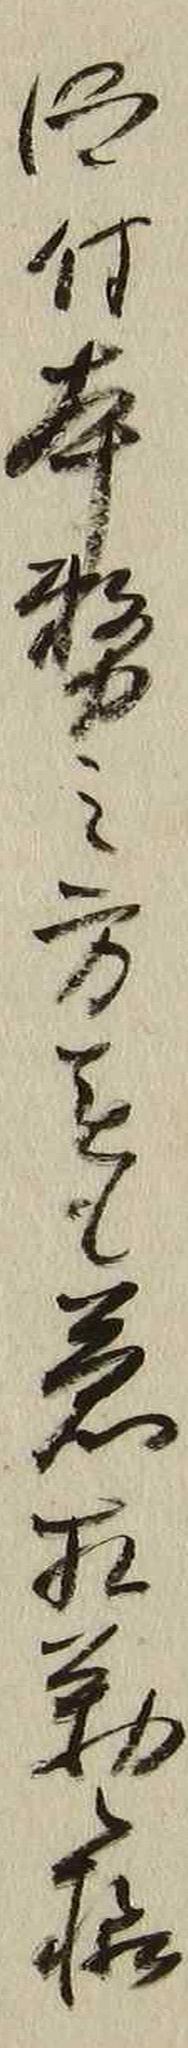仰付本務之方をも兼相勤候様
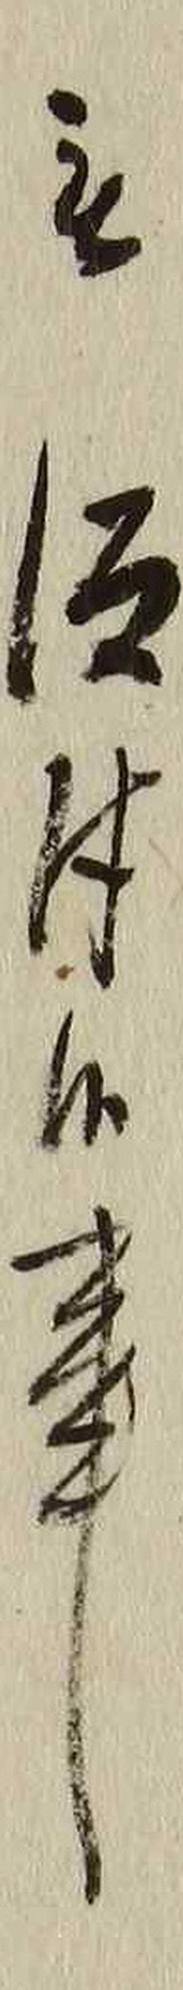被仰付候事
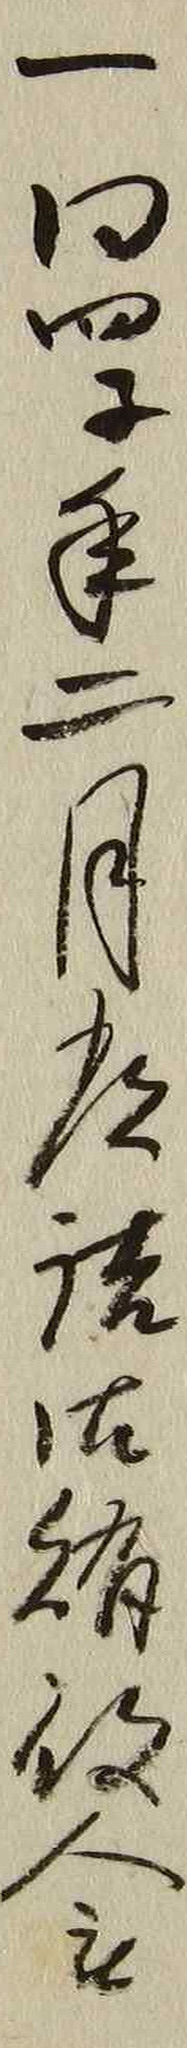一同四子年二月常詰御賄役人被
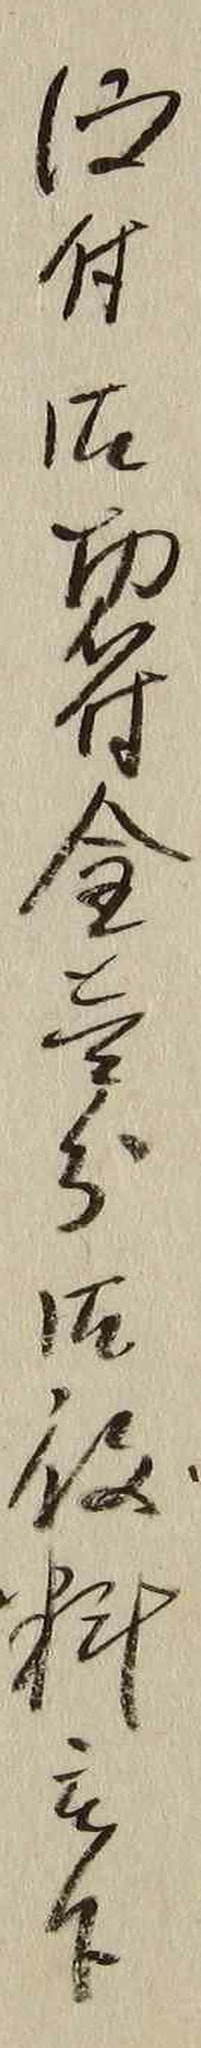仰付御切符金壱分御役料被下
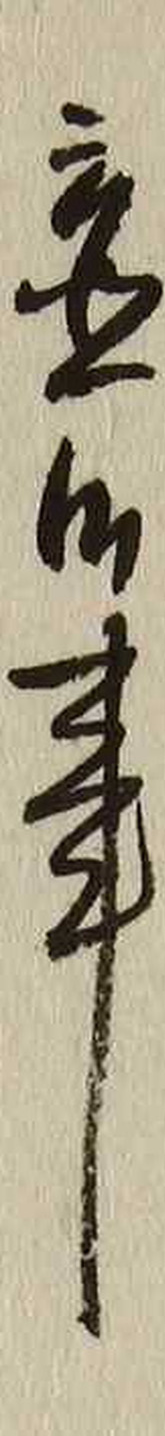置候事
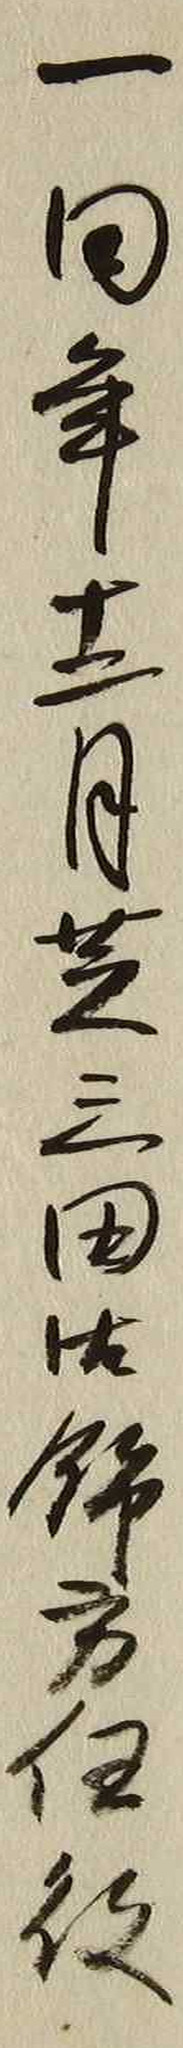一同年十二月芝三田御飾方任役
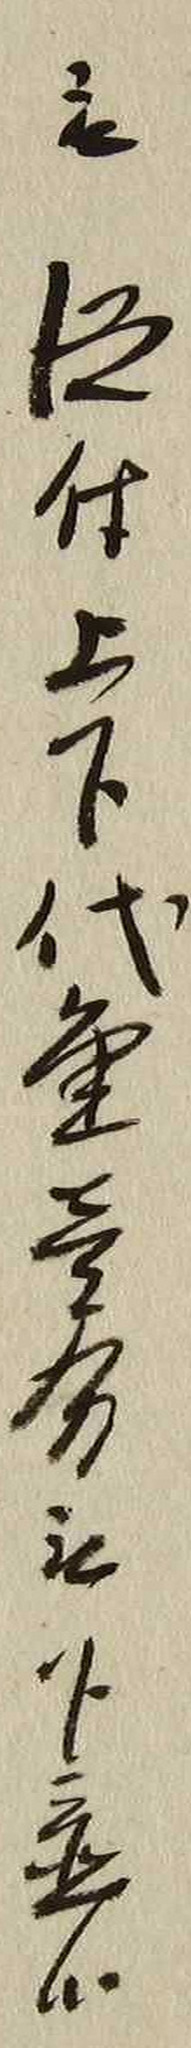被仰付上下代金壱分被下置候
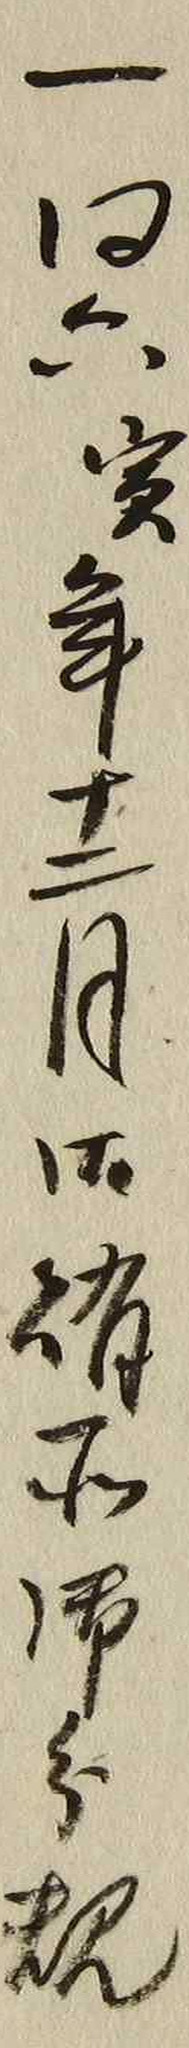一同六寅年十二月御賄所御分規
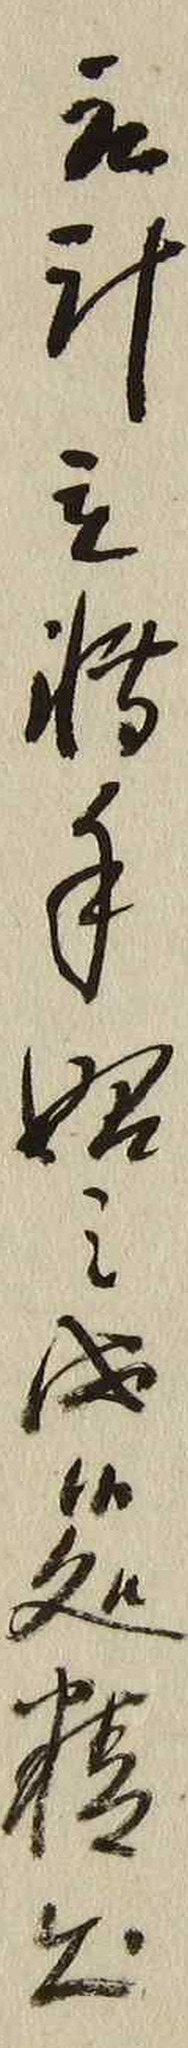取計被転手始之儀候処精出
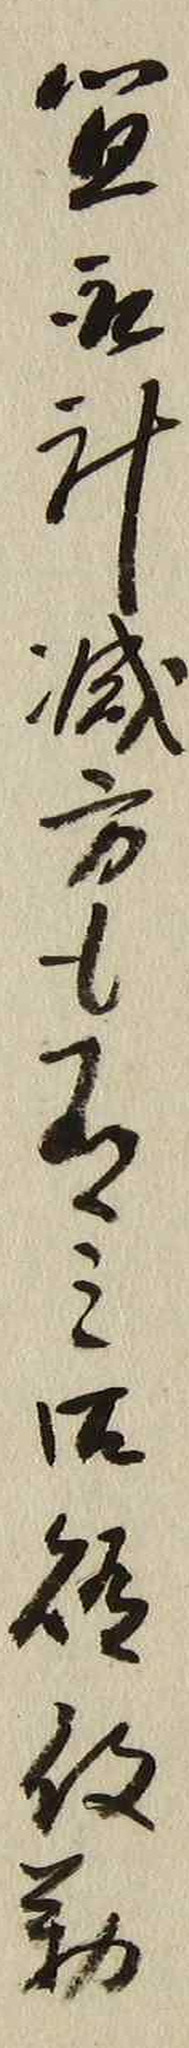宜取計減方も有之御賄役勤
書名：諸士系譜　巻之353　す之部3
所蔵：会津若松市立会津図書館
